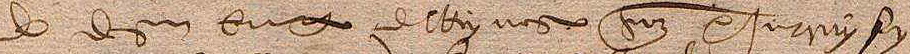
do desembargo del Rey noso S̄or e Jmquysy
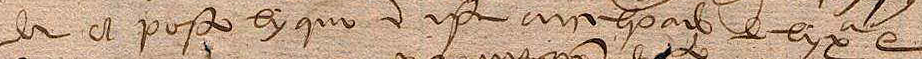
dor Apostolyquo ē este arcebpado de lyxa e
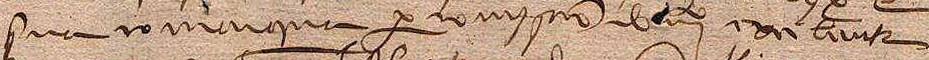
sua comarqua ꝑ comjsão do mto excelente
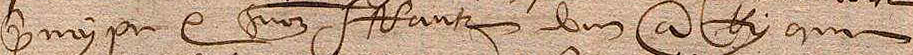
pincype e S̄nor Jffante dom āRyque
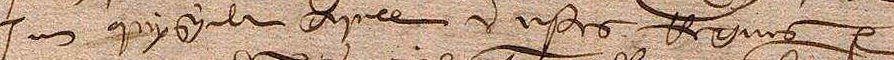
Jmquysydor gerall ē estes Regnos e
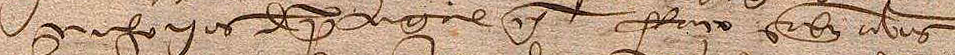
senhorjos de p̄otugal c̄ꝭ ffaço sābr a vos
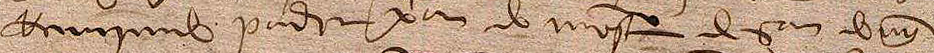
Reuerendo padre pior do mostro de sam dom̄j
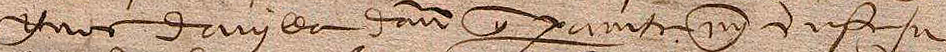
guos da uylla dauro q̄ ꝑamte m̄j ē este Ju
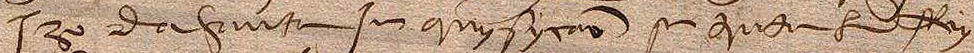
Jzo da Santa Jmquysycão se trata hū ffey
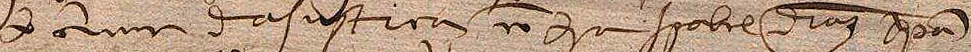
to cime da Justiça c̄otra Jsabel diaz xpā
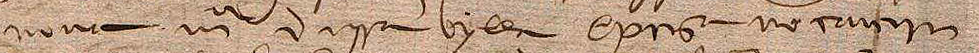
noua mor ē essa vylla e presa no carçere
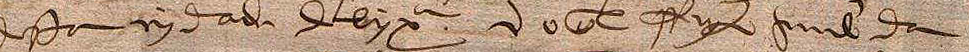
desta cydade de lyxa ē o q̄l ffeyto sendo da
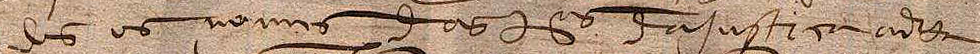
dos os nomes das tsas da Justica a dita
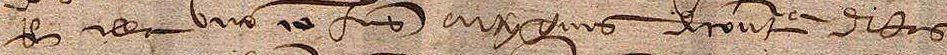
Re ella veio c̄o hūs artyguos de contraditas
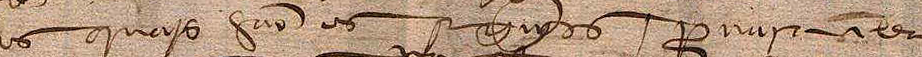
os quays são os segūjtes / ꝓuara ella
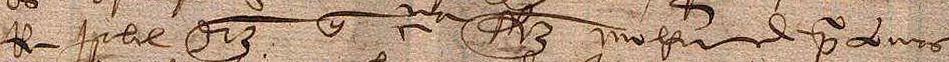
Re Jsabel d̄iz q̄ cna f̄frz molher de p̄o tomas
